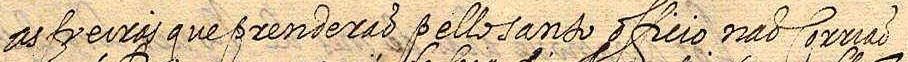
as freiras que prenderaõ pello santo officio naõ Corriaõ
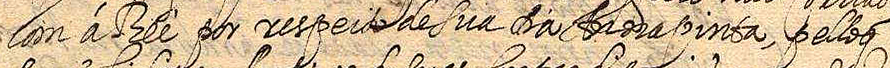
com a Reé por respeito de sua tia Anna pinta, pello q̄
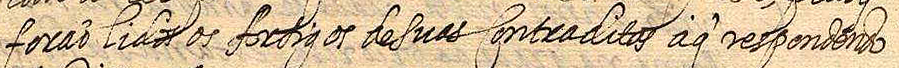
foraõ lidos os Artigos de suas Contraditas a q̄ respondendo
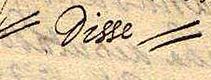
// Disse //
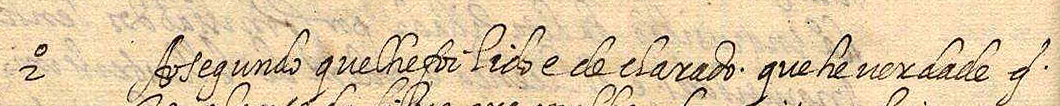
2o Ao segundo que lhe foi lido e declarado. que he uerdade q̄.
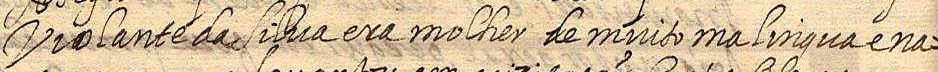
Violante da Silua era molher de muito ma lingua e na
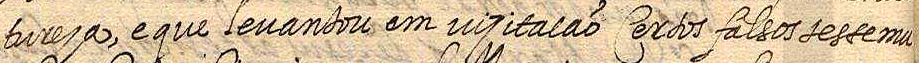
tureza, e que leuantou em uizitacaõ Certos falsos testemu
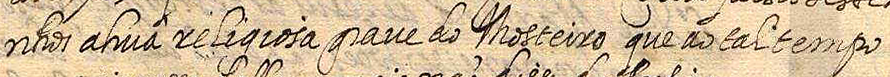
nhos a huā religiosa graue do Mosteiro que ao tal tempo
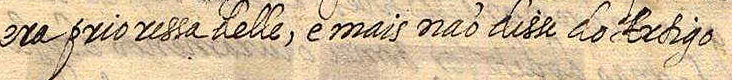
era prioressa delle, e mais naõ disse do Artigo
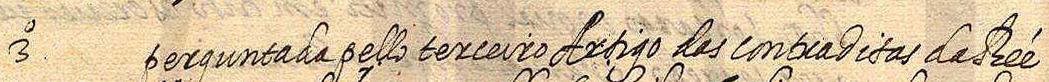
3o perguntada pello terceiro Artigo das contraditas da Reé
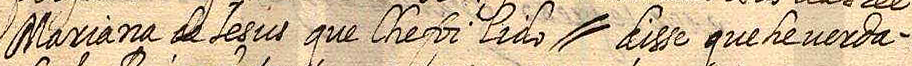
Mariana de Iesus que lhe foi lido // disse que he uerda
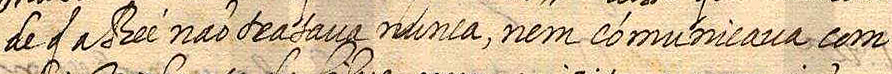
de q̄ a Reé naõ trataua nunca, nem cōmunicaua com
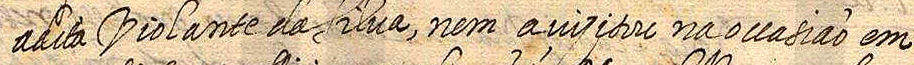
a dita Violante da Silua, nem a uizitou na occasiaõ em
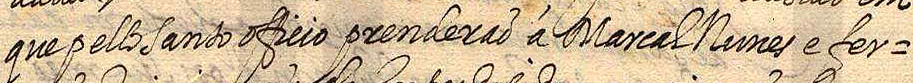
que pello santo officio prenderaõ a Marcal Nunes e fer
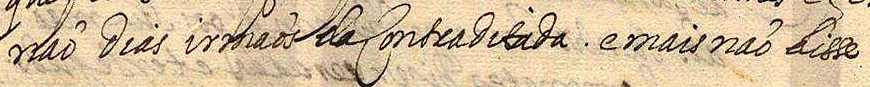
naõ dias irmaõs da Contraditada. e mais naõ disse
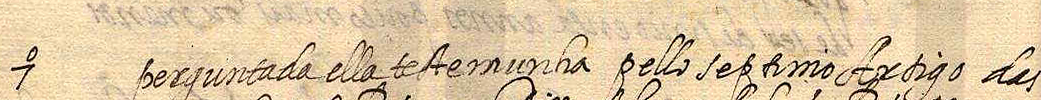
7o perguntada ella testemunha pello septimo Artigo das
